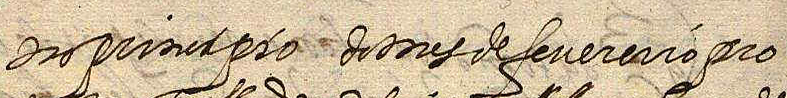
no principio do mes de feuereiro pro
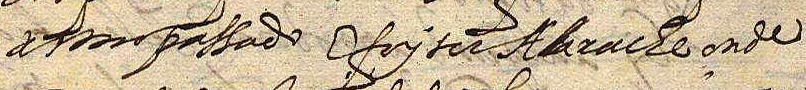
ximo passado E foy ter A larache onde
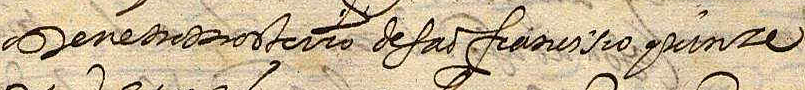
esteue no mosteiro de saõ francisco quinze
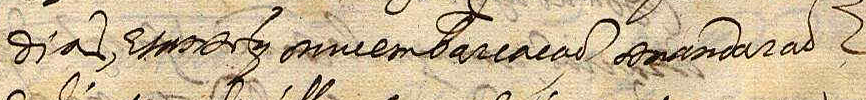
dias, E tanto q̄ ouue embarcaçaõ, o mandaraõ
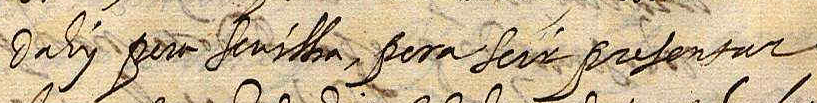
dahy pera Seuilha, pera se ir presentar
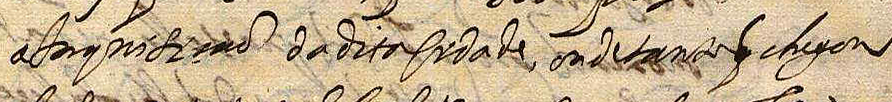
a Inquisiçaõ da dita Cidade, onde tanto q̄ chegou
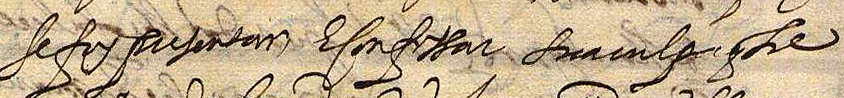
se foy presentar, E Confessar sua culpa q̄ he
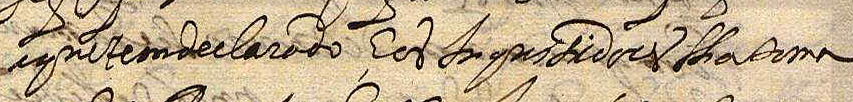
a que tem declarado, E os Inquisidores lha toma
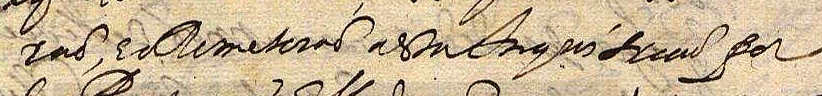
raõ, E o Remeteraõ a esta Inquisiçaõ por
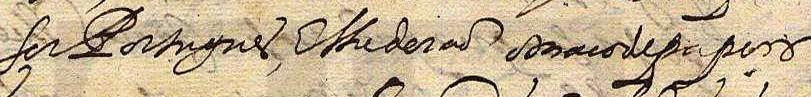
ser Portugues, E lhe deraõ o maço de papeis
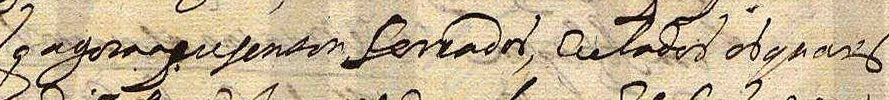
q̄ agora apresentou Serrados, E celados os quais
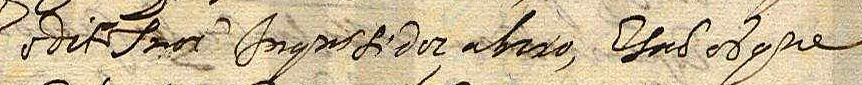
o dito Snor̄ Jnquisidor abrio, E saõ os que
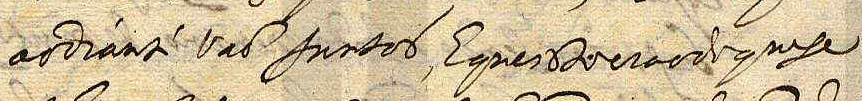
ao diante vaõ Juntos, E que isto era o do que se
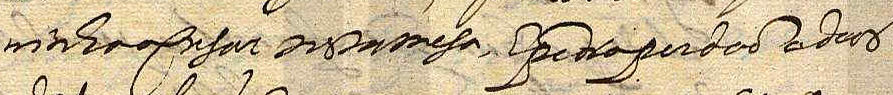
uinha aCusar nesta mesa, E pedia perdaõ a deos
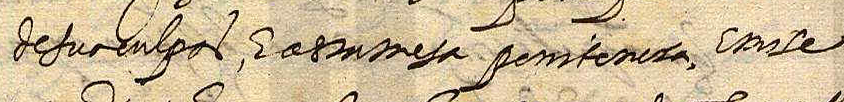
de sua culpas, E a esta mesa penitencia, E mise
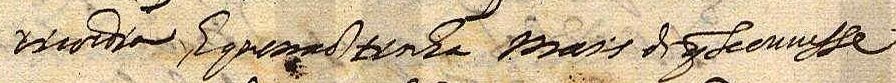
ricordia, E que naõ tinha mais de q̄ se ouuesse
